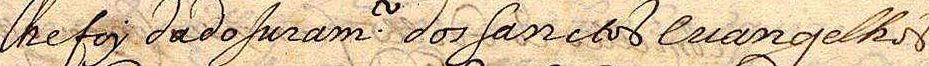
lhe foy dado Juram.to dos Sanctos euangelhos
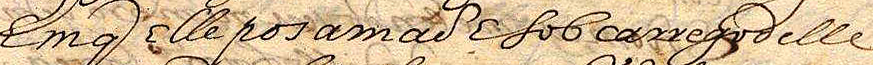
Em q̄ Elle pos a maõ E sob carrego delle
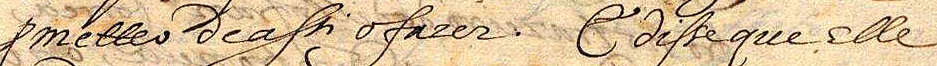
ꝓmetteo de assi o fazer. E disse que Elle
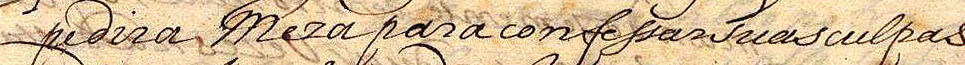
pedira Meza para confessar suas culpas
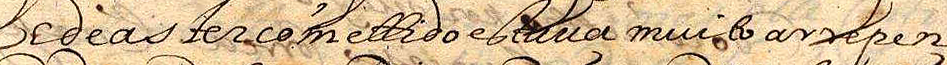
E de as ter com̄ettido estaua muito arrepen
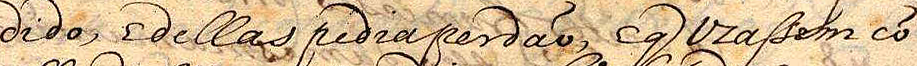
dido, E dellas pedia perdaõ, E q̄ Vzassem cō
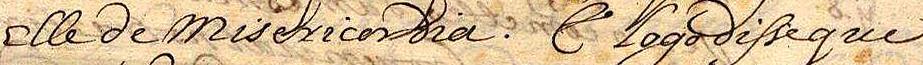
Elle de Misericordia. E logo disse que
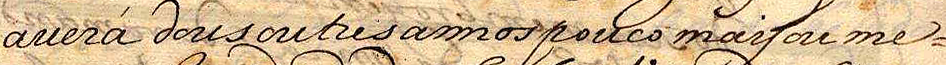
auerá dous ou tres annos pouco mais ou me
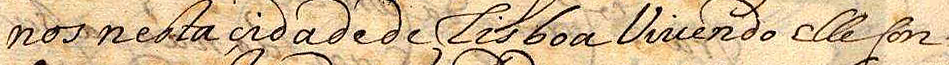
nos nesta çidade de Lisboa Viuendo Elle Con
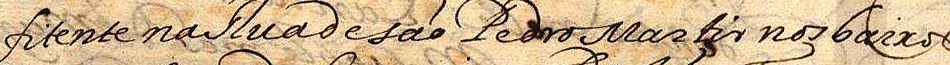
fitente na Rua de saõ Pedro Martir nos baixos
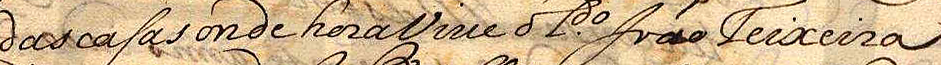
das casas onde hora Viue o l.do João Teixeira
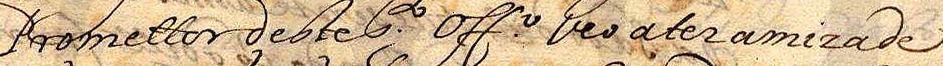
Promettor deste s.to Off.o veo a ter amizade
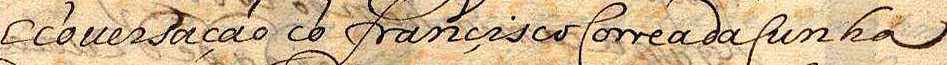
E cōuersaçaõ cō françisco Correa da Cunha
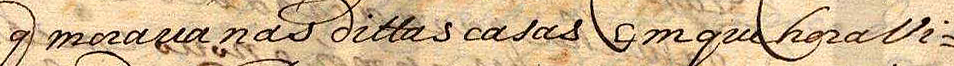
q̄ moraua nas dittas casas Em que hora Vi
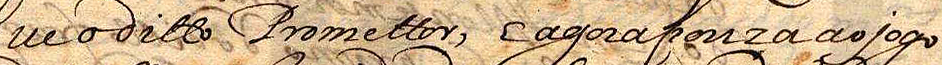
ue o ditto Promettor, E agora pouza ao jogo
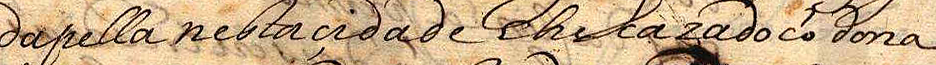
da pella nesta çidade E he cazado cō dona
